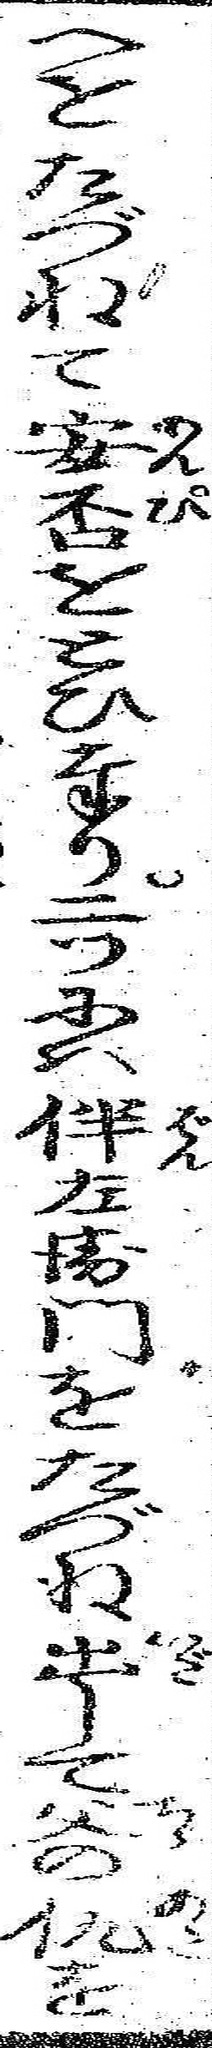へをたづねて安否をとひ奉り。二ツには伴左衛門をたづね出して父の仇を
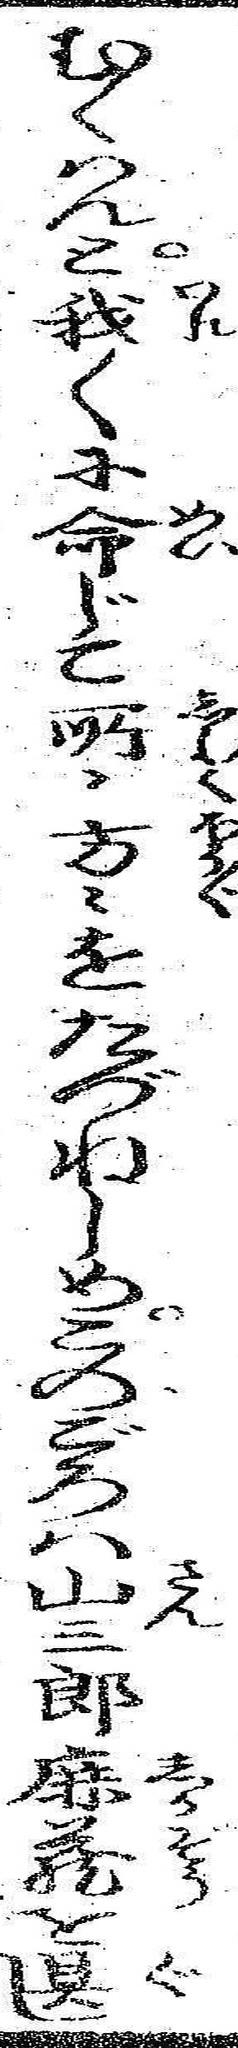むくはんと。我〳〵に命じて所々方々をたづねしめ。このごろは山三郎鹿蔵を具し
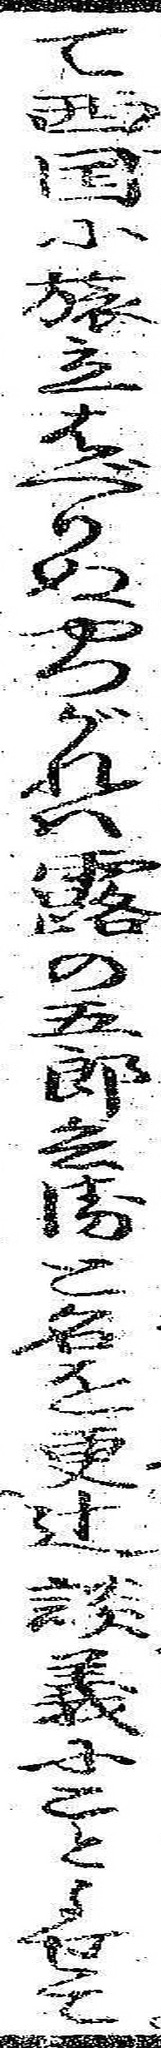て西国に旅立はべりぬ。やつがれは露の五郎兵衛と名を更。辻談義にことよせて。
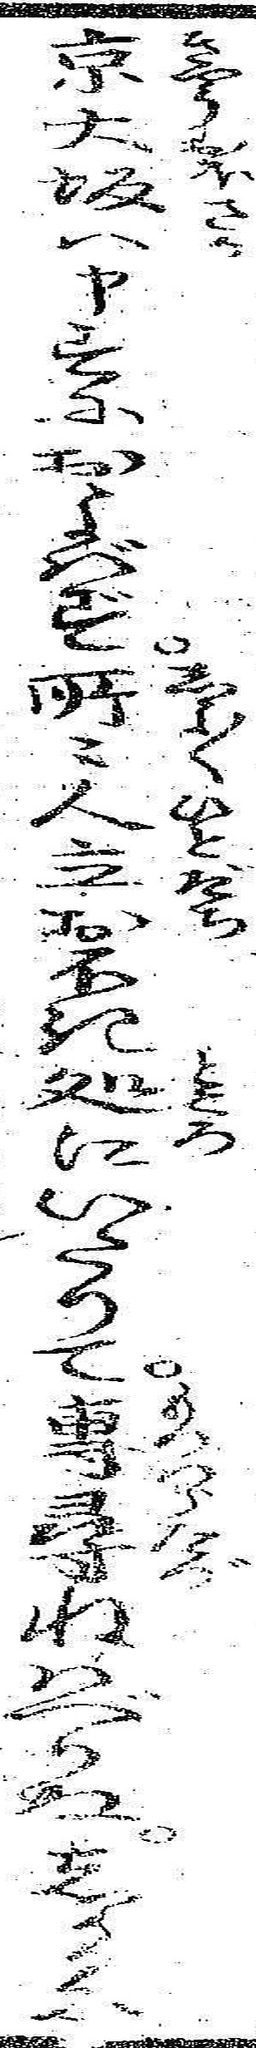京大坂は申すにおよばず。所々人立おほき処にいたりて。専尋ねはべりぬ。しかるに
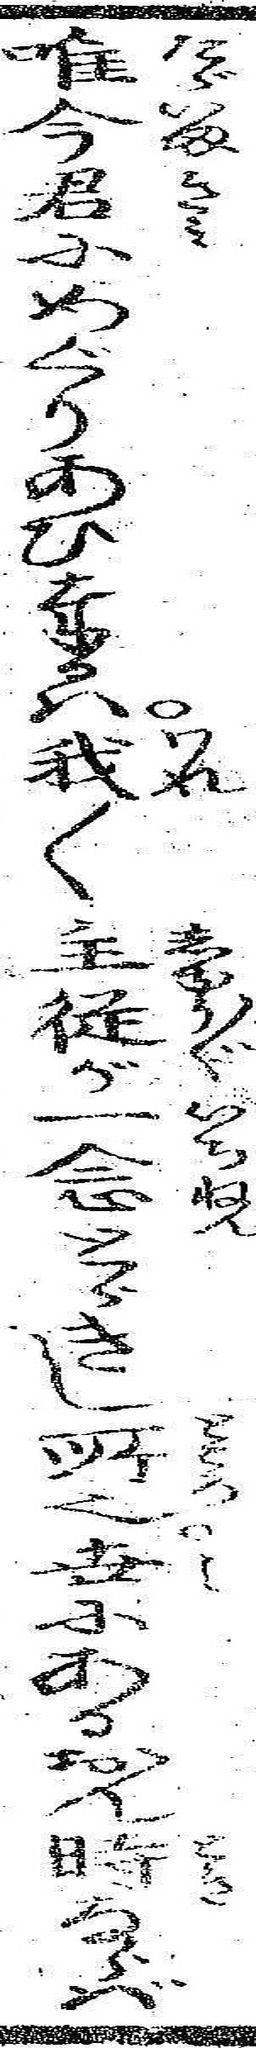唯今君にめぐりあひ奉るは。我〳〵主従が一念とゞきし所也。世にあるおん時ならば
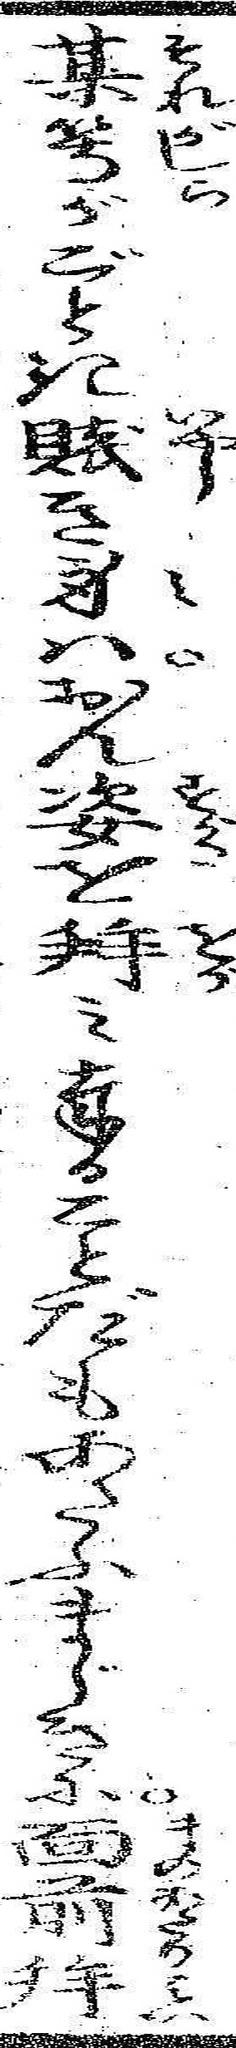某等がごとき賎き身は。おん姿を拝み奉ることだもあたふまじきに。面前拝
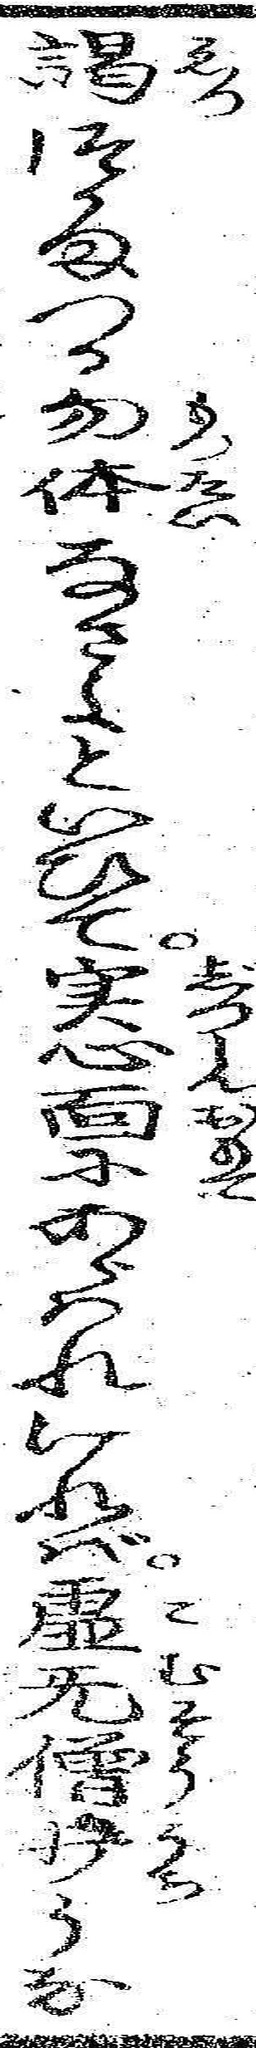謁つかまつる勿体なさよといひて。実心面にあらはれければ。虚無僧打うな
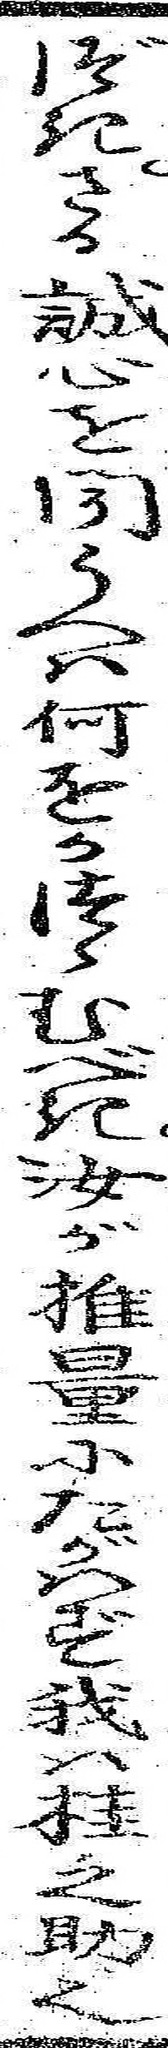づき。さる誠心を聞うへは何をかつゝむべき。汝が推量にたがはず我は桂之助也。
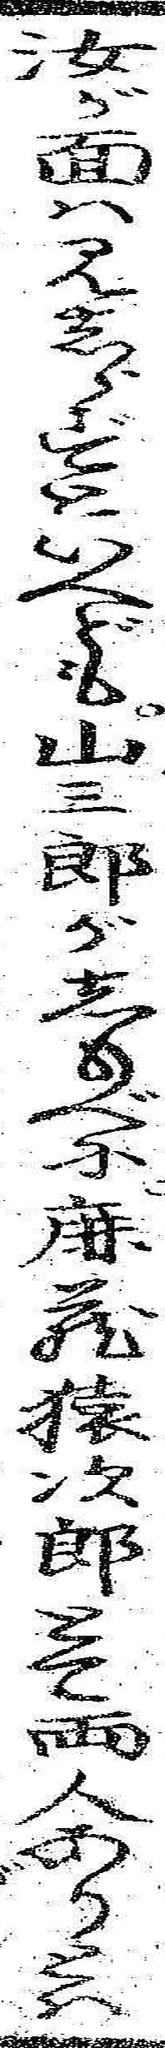汝が面は見しらずといへども。山三郎がしもべに。鹿蔵猿次郎とて両人ありとは
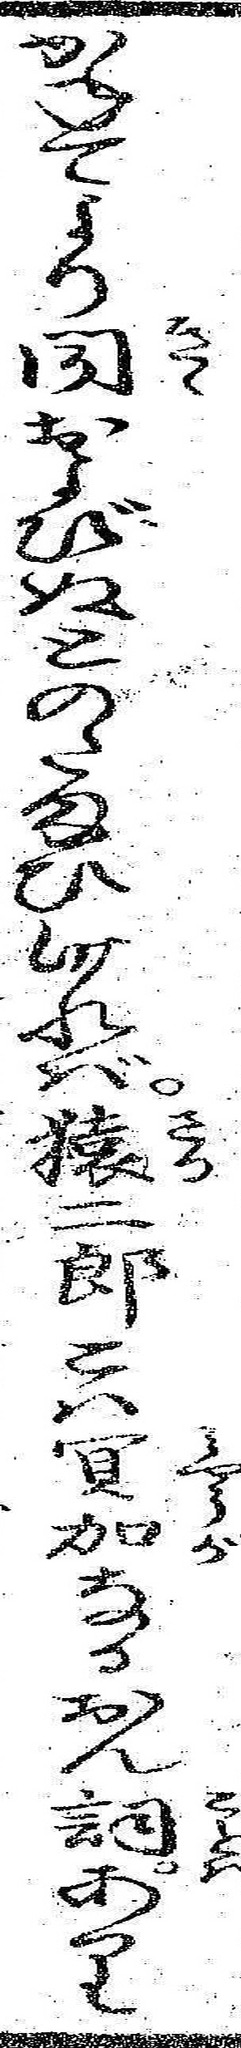かねてより聞およびぬとのたまひければ。猿二郎こは冥加なるおん詞。あり
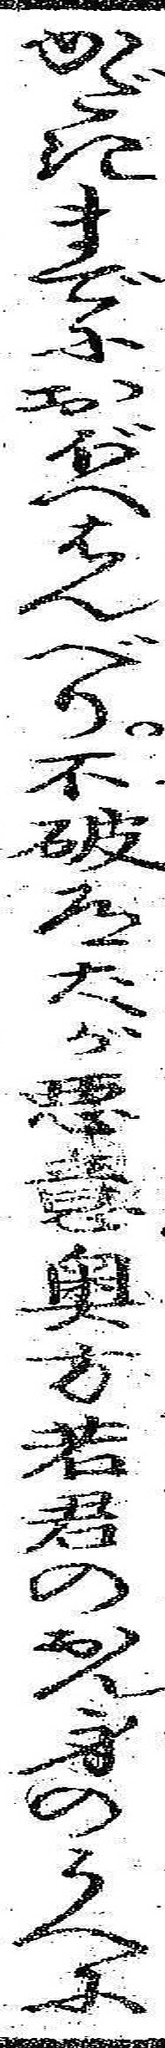がたきまでにおぼへはんべり。不破道犬が悪意。奥方若君のおん身のうへに

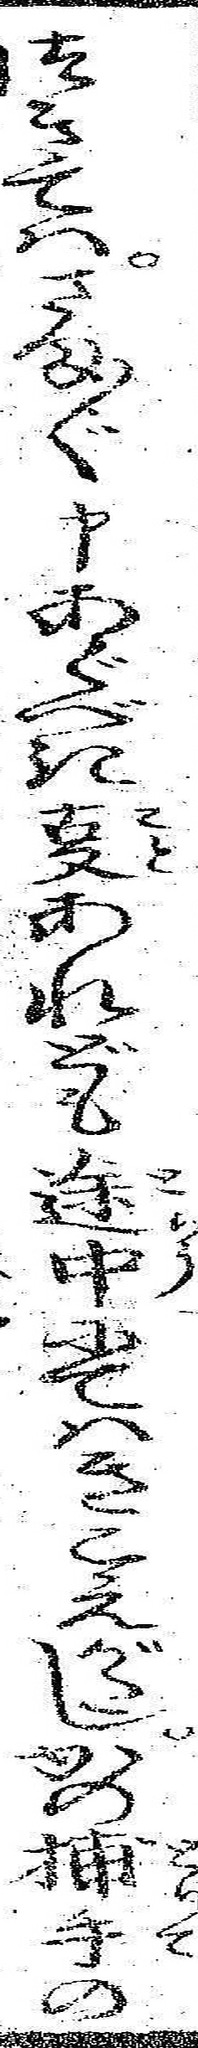つきては。さま〴〵申あぐべき事あれども途中にてはきこえがたし。かの捕手の
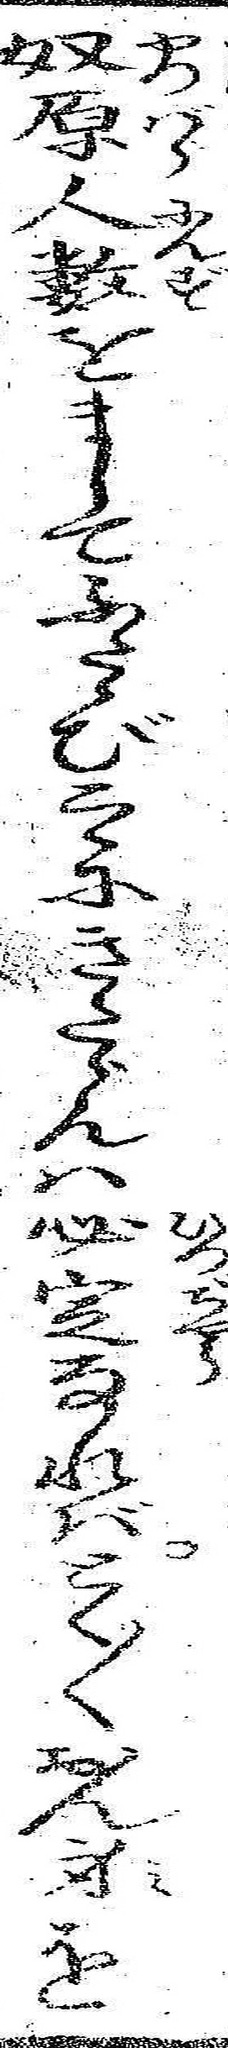奴原人数をましてふたゝびこゝにきたらんは必定なれば。とく〳〵おん身を
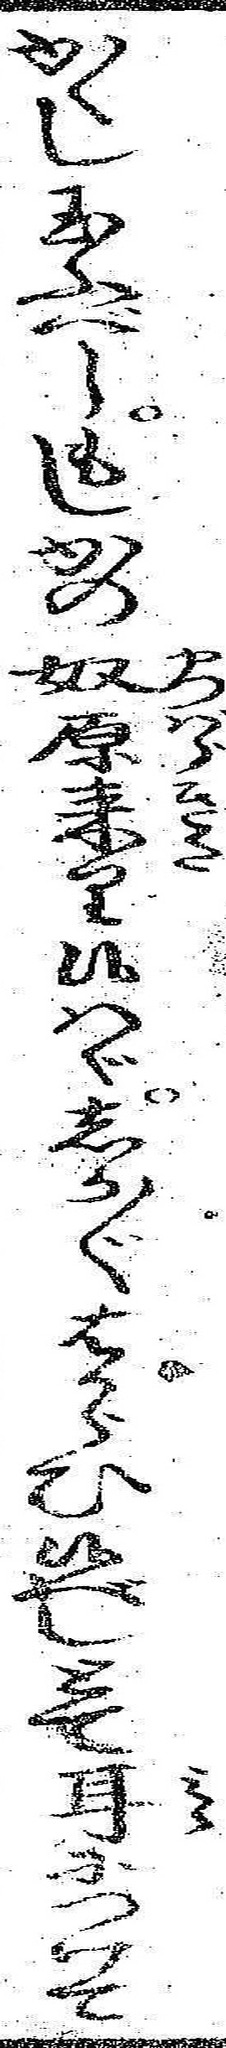かくし玉ふべし。もしかの奴原来り候はゞ。しか〴〵はからひ候べしとて耳につけて
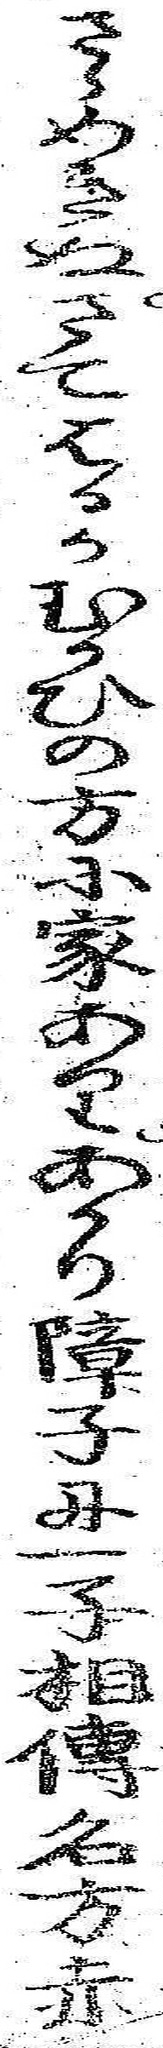さゝめきぬ。さてはるかむかひの方に家あり。あかり障子に一子相伝名方赤
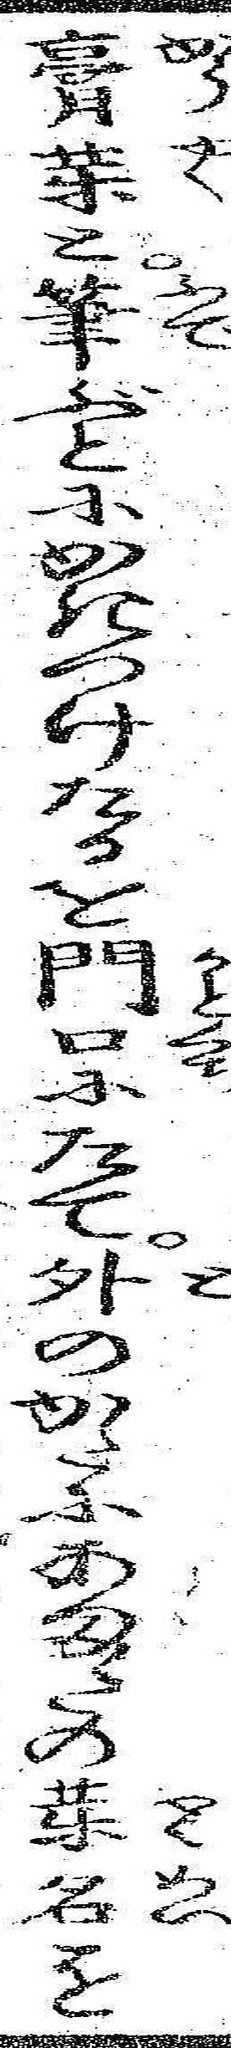膏薬と。筆ぶとにかきつけたるを門口にたて。外のかたにあまたの薬名を
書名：昔話稲妻表紙
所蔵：国文学研究資料館
